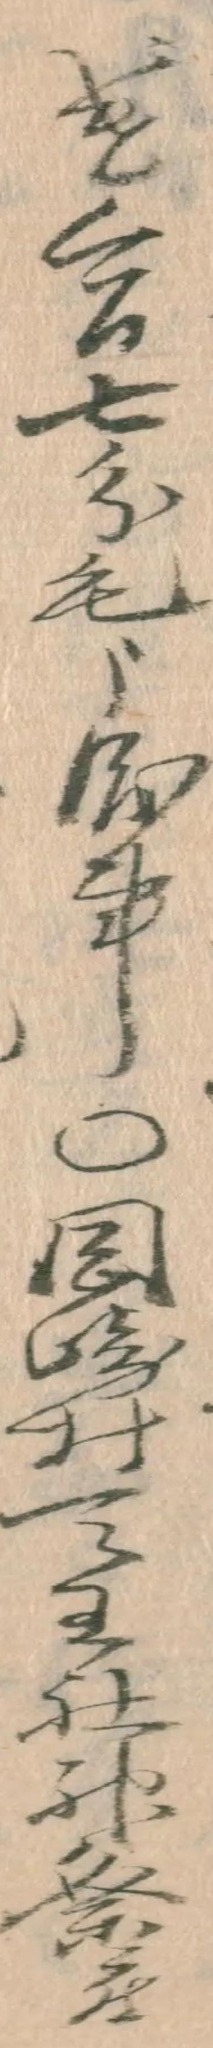ニ遣今日七分毛申渡事○岡崎村天王社神祭ニ付
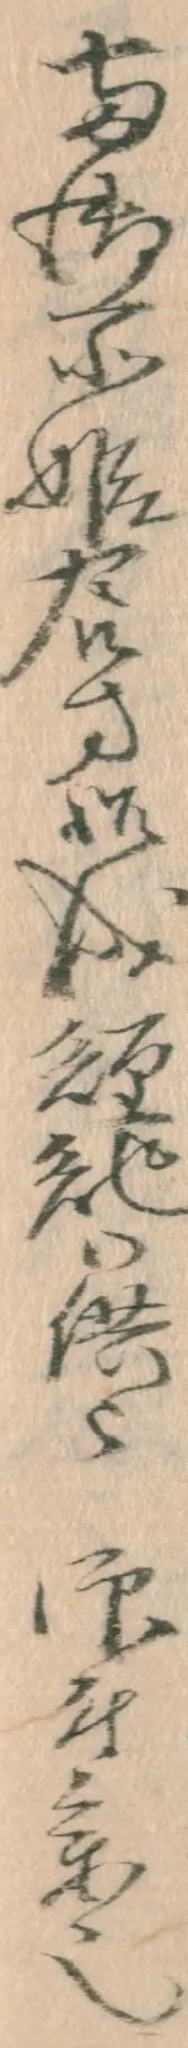両御所姫君方御成経紀御供被仰付置也
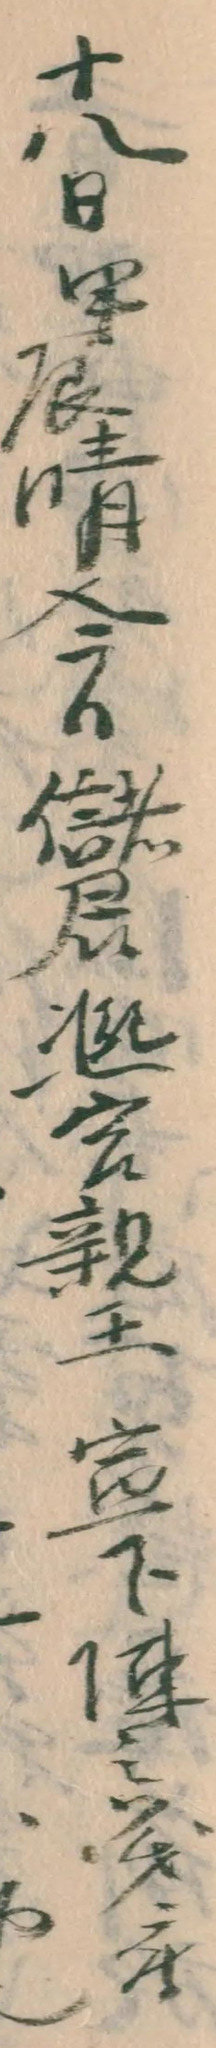十八日甲辰晴今日儲君熙宮親王宣下陣之義ニ付
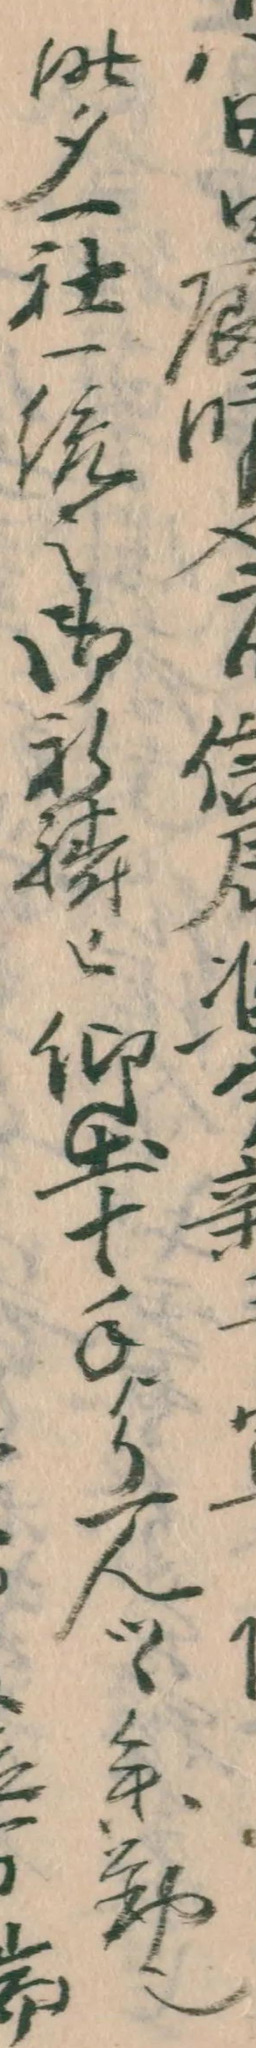昨夕一社一統之御祈祷被仰出十手より一人ツヽ参勤也
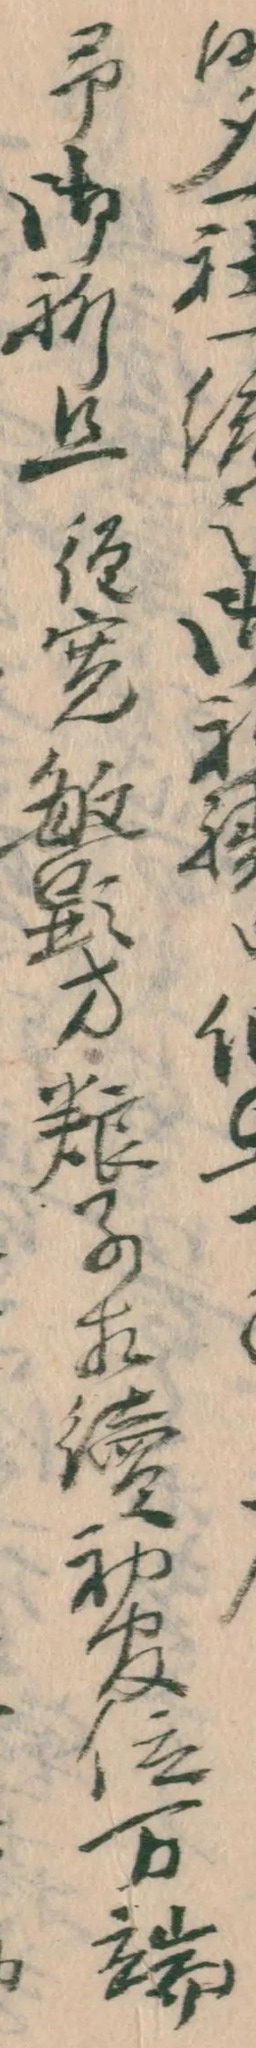予御祈且経寛敏顕方養子相續初官位万端
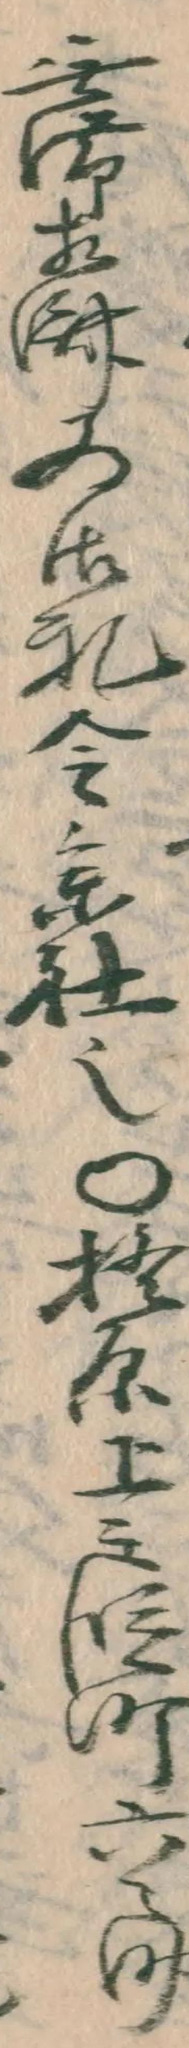無滞相済為御礼令参社也○柊原上之段町六之助
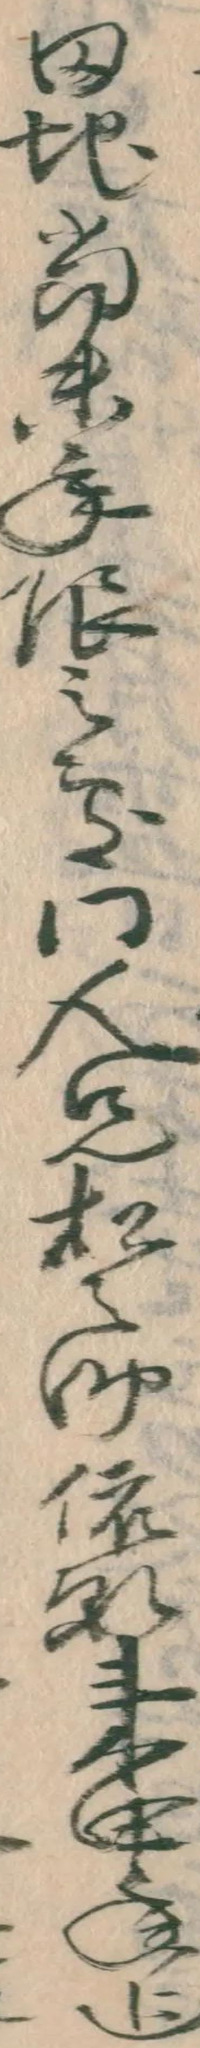田地當未年限之處同人兄松之助依頼来申年迄
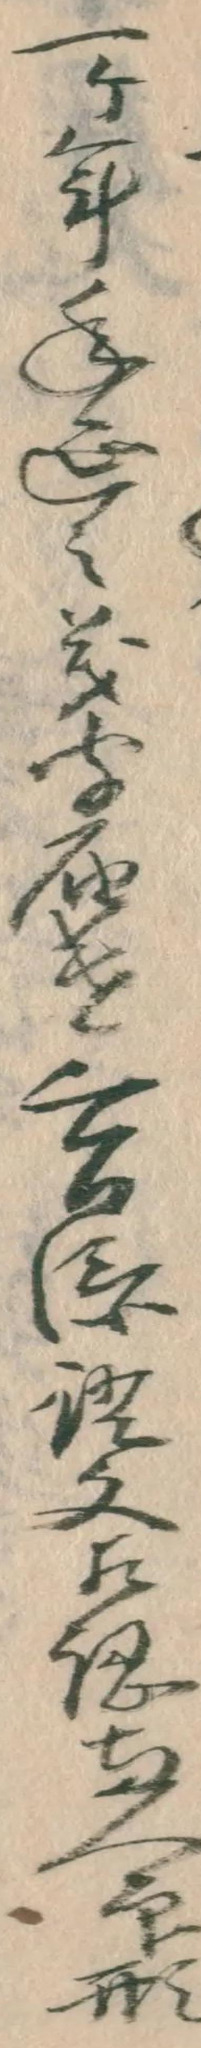一ヶ年延之義聞届遣今日添證文相認両人印形
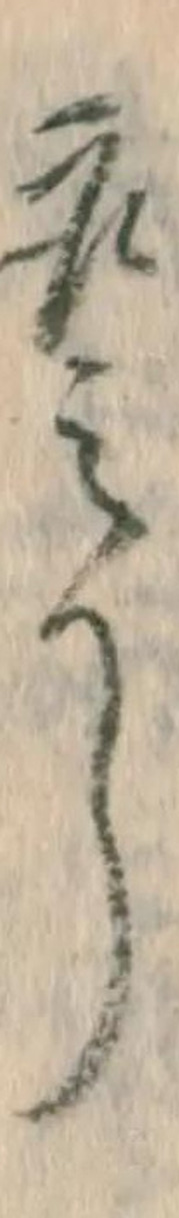取之了
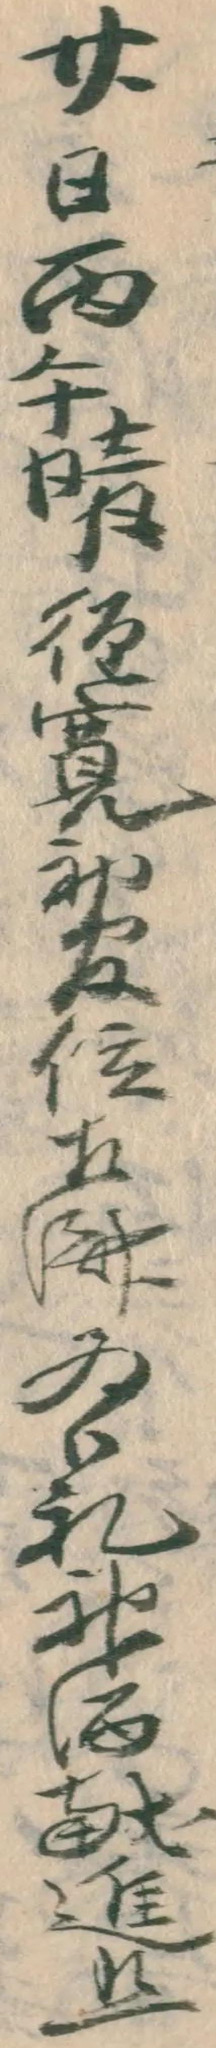廿日丙午晴経寛初官位相済為御礼神酒献進且
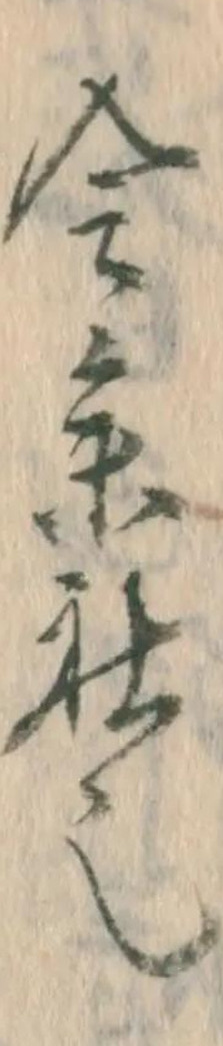今参社也
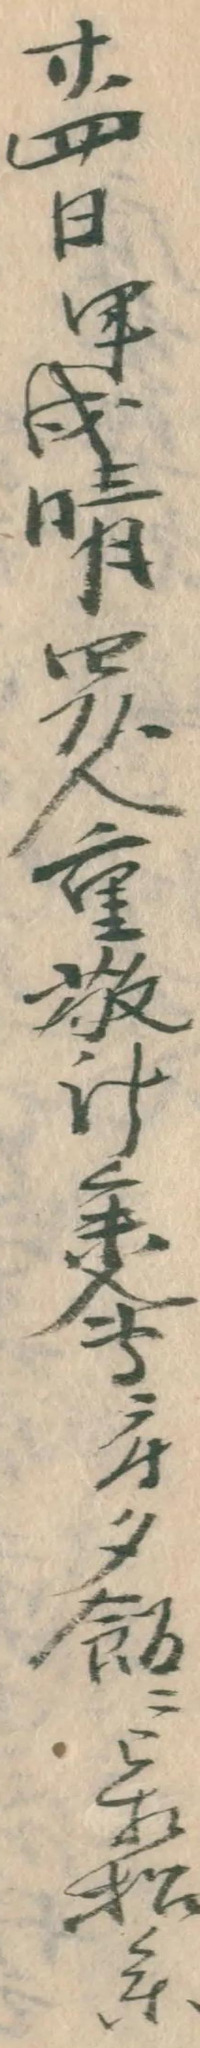廿四日甲戌晴四頭人重敬汁参會ニ付夕飯ニ被相招参
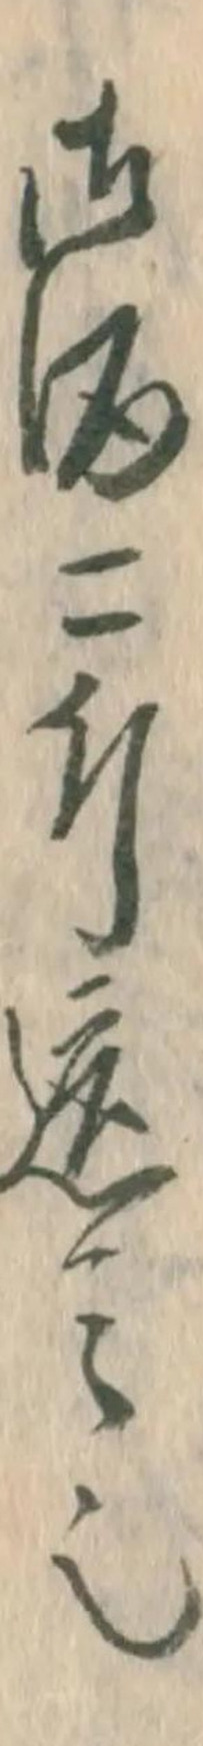御酒二升送之也
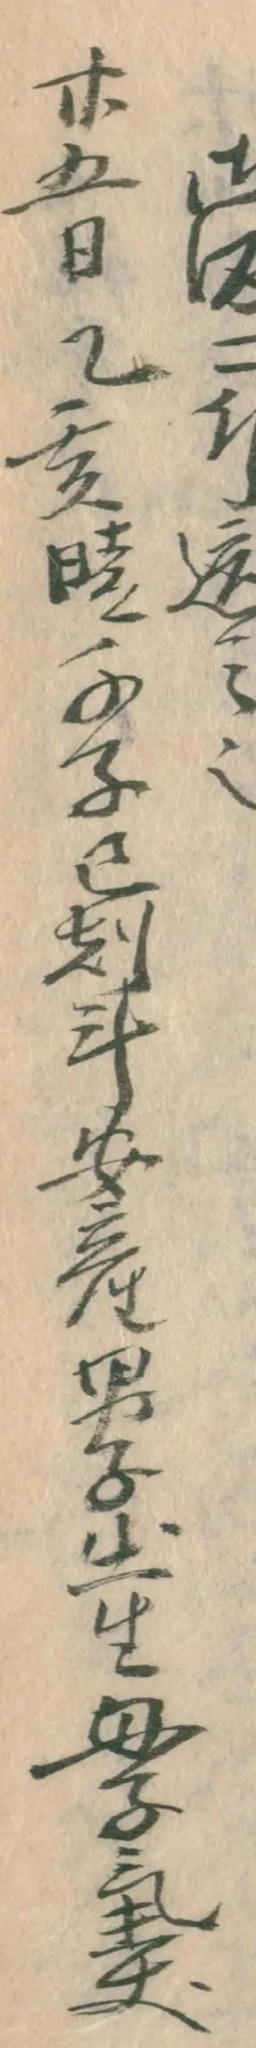廿五日乙亥晴千子巳刻斗安産男子出生母子気丈

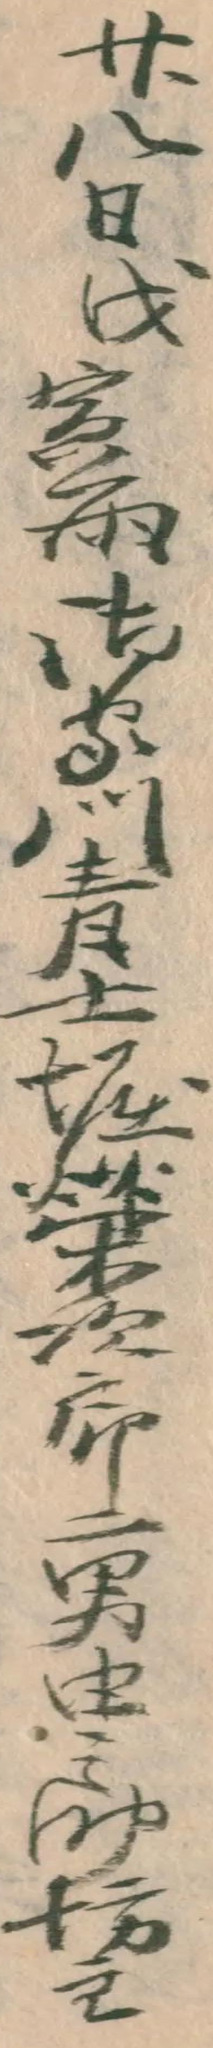廿八日戊寅両御家門青土堀榮次郎二男由之助坊主
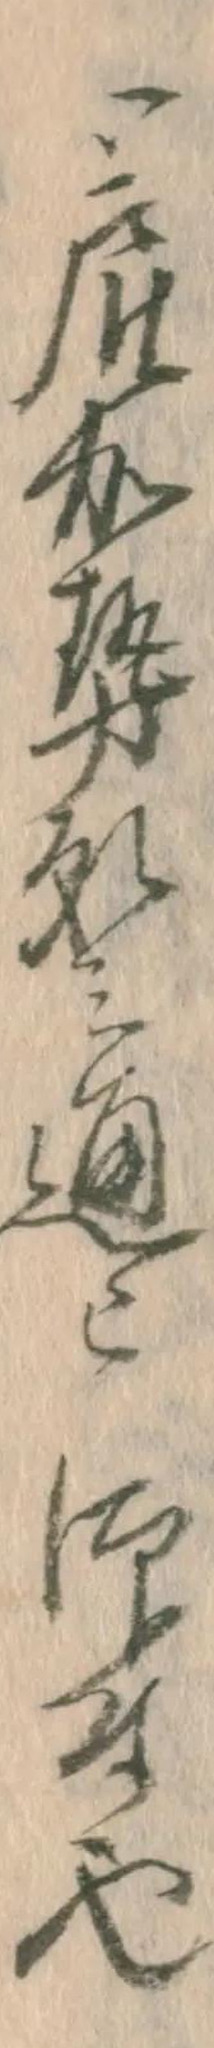御雇加勢願之通被仰付也
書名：賀茂社記録. 第67冊
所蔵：国立国会図書館 National Diet Library, JAPAN
